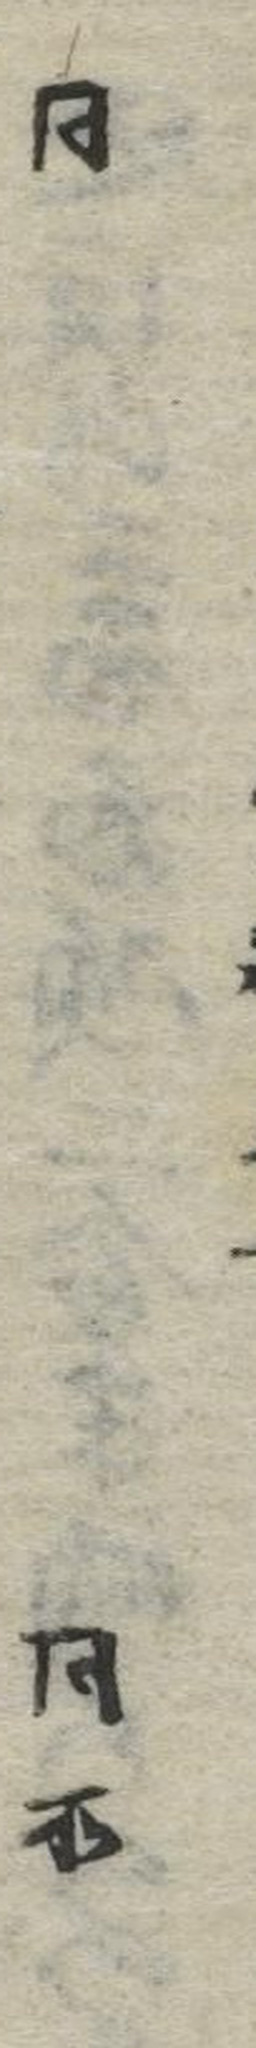同同所
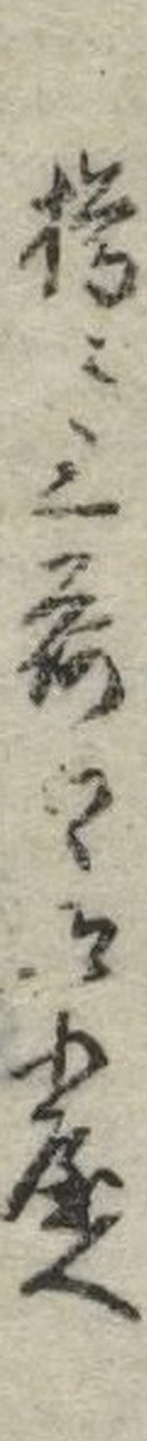樽三荷ツゝ御小屋へ内田
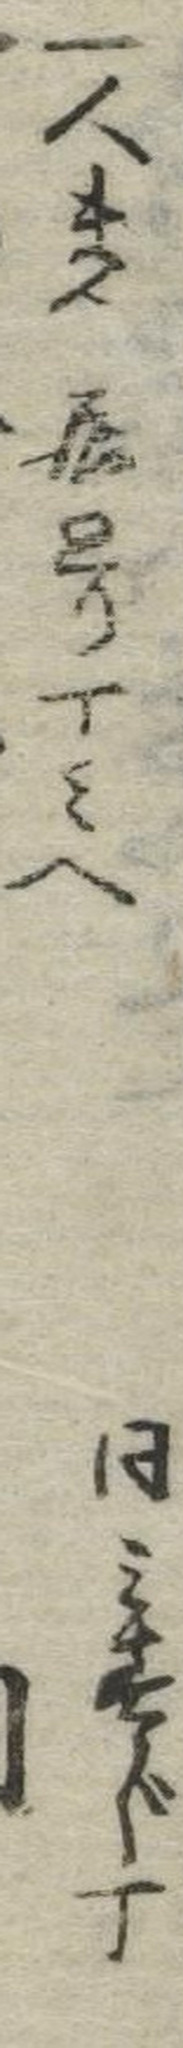一人まへ居廻り丁々へ同ミすじ丁
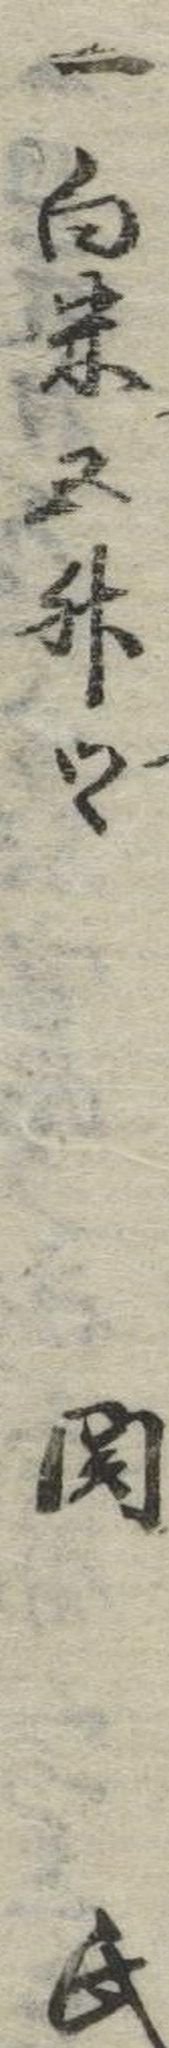一白米五升ツゝ関氏
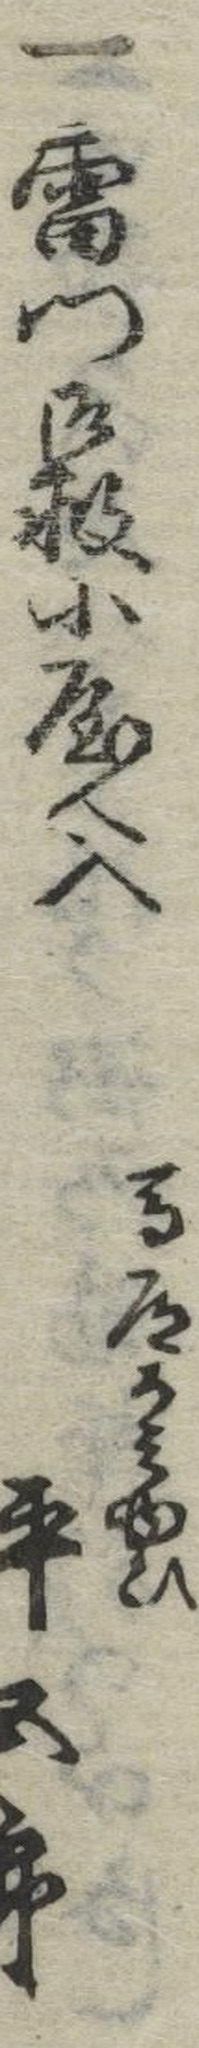一雷門御救小屋へ入馬道かミゆひ
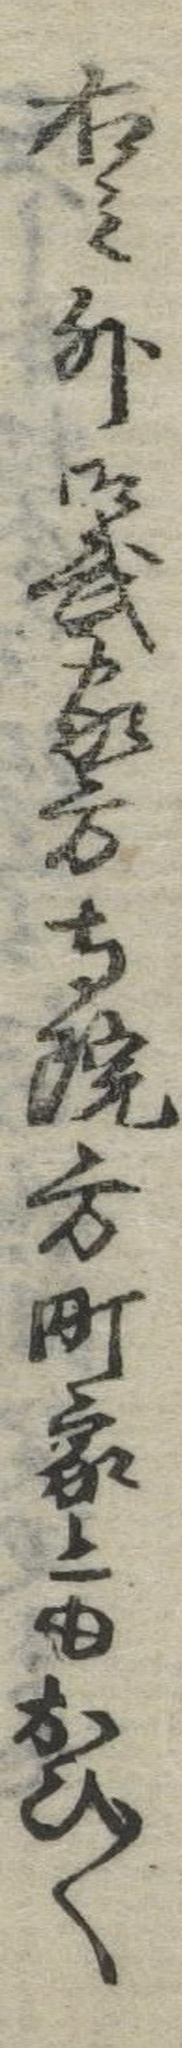右の外御武家方寺院方町家ともおひ〳〵
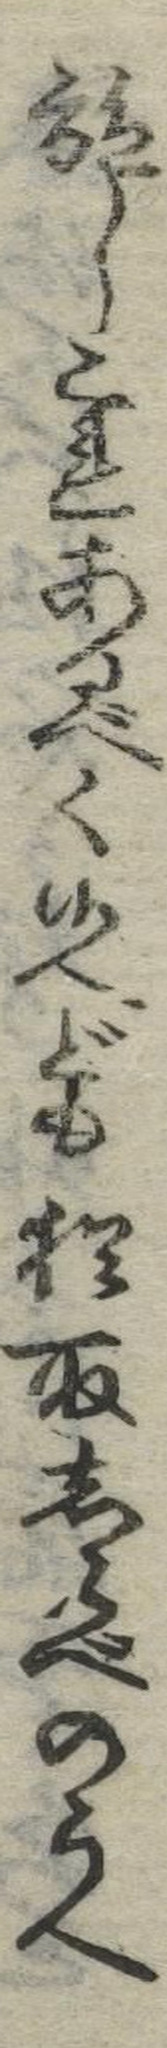施しこれあるべく候へども猶取しらべのうへ
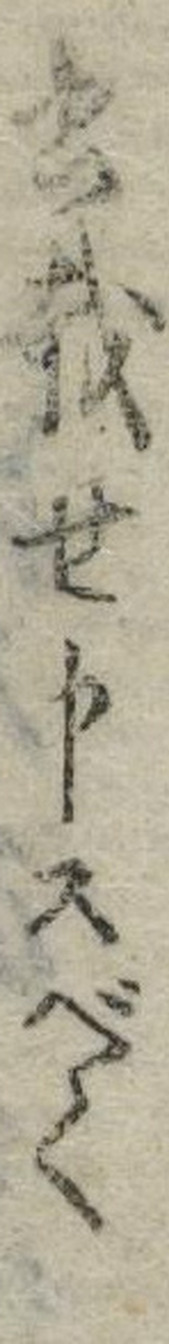書載せ申べく

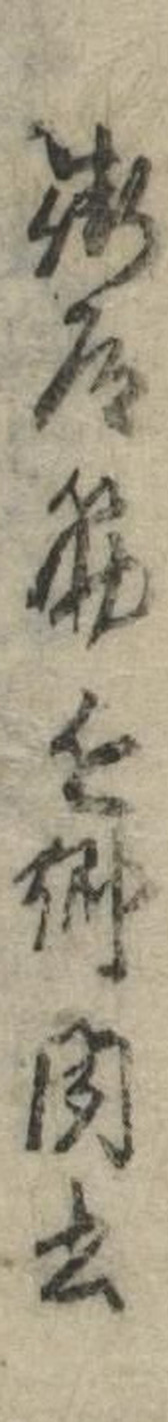街道筋近郷聞書
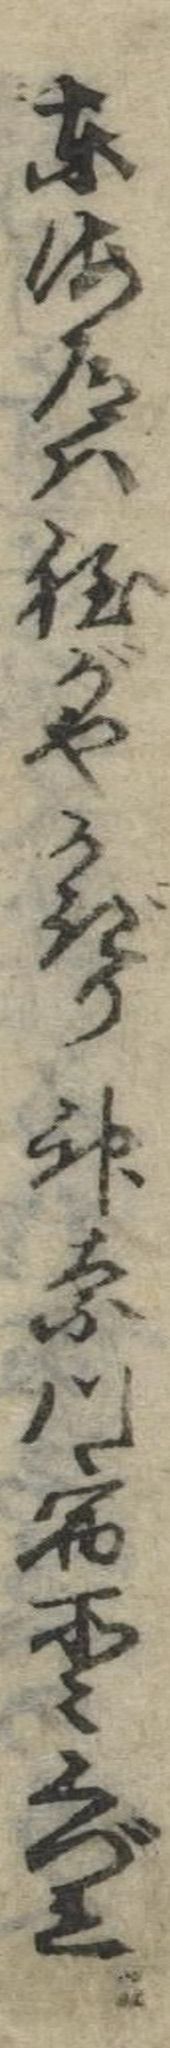東海道ハ保土がやかきり神奈川宿所々くづれ
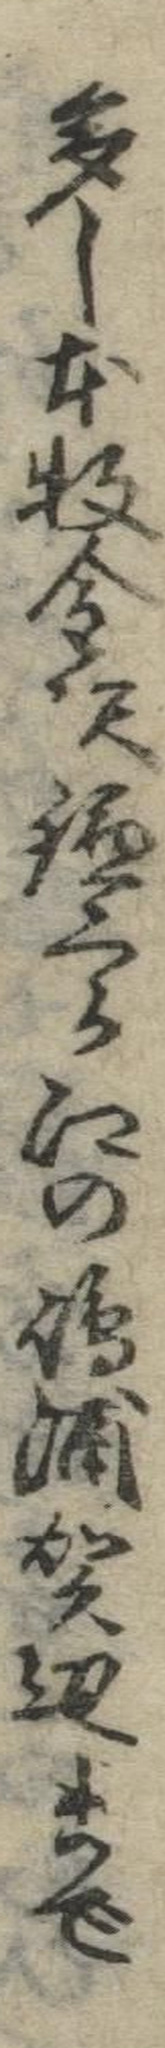多し本牧金沢鎌くら江の嶋浦賀辺まで
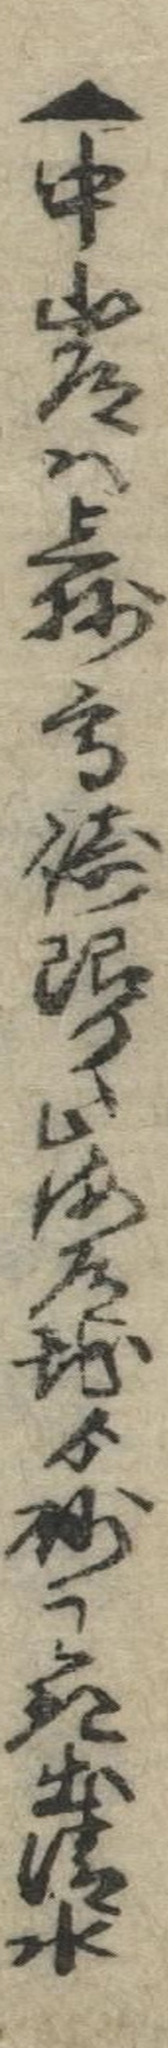▲中山道ハ上州高崎限り此海道地ゟ砂わき出清水
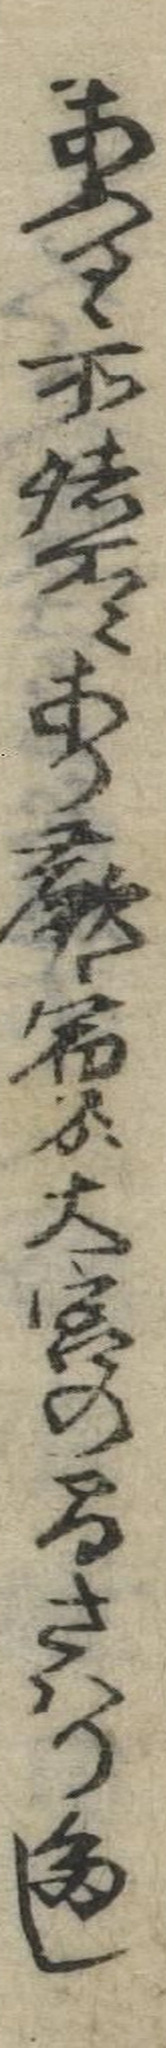あふるゝ所諸所あり蕨宿ゟ大宮の間さハり多し
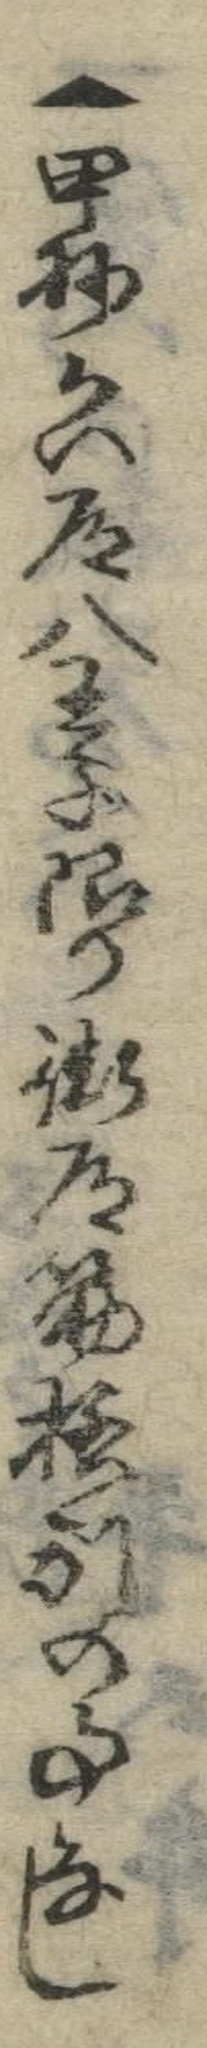▲甲州かい道ハ王子限り海道格別の事なし
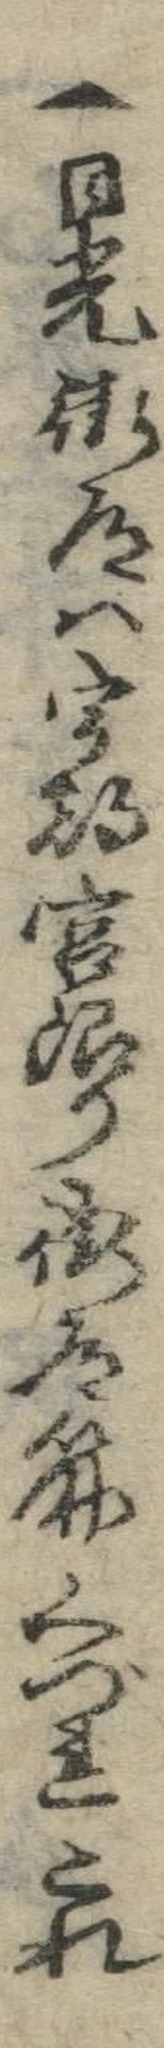▲日光街道ハ宇都宮限り街道筋くづれこれ
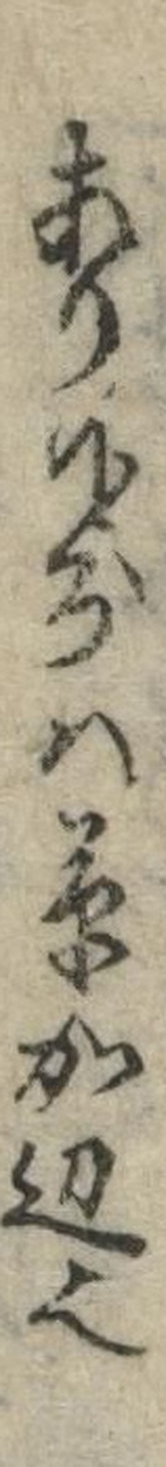あり候分ハ草加辺也
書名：安政二卯十月二日夜四ツ時過　御府内御屋敷方市中共　地震類焼場所明細書之寫　并街道筋近郷聞書
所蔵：東京大学地震研究所図書室 Earthquake Research Institute Library, The University of Tokyo, JAPAN
